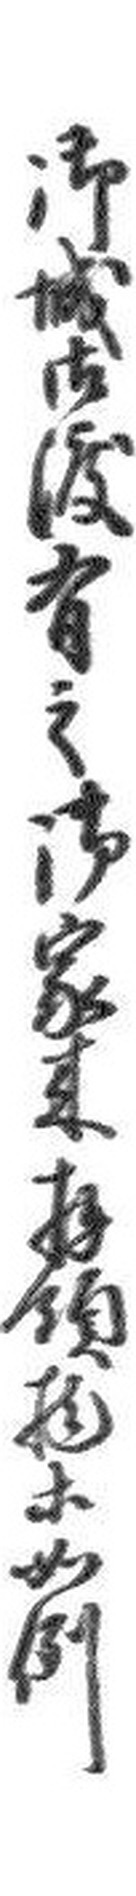御城御渡有之御家来拝領物等如例
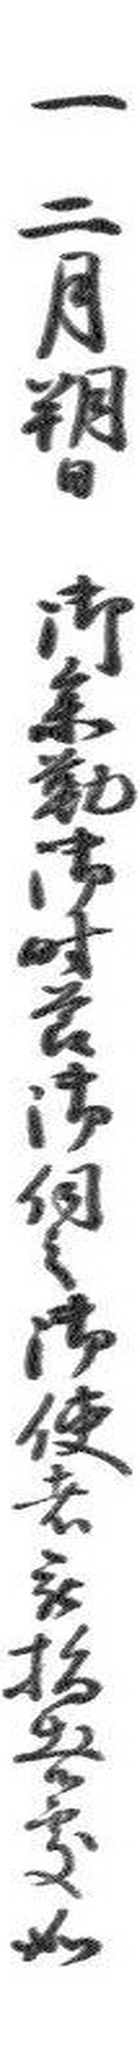一二月朔日御参勤御時節御伺之御使者被指出候処如
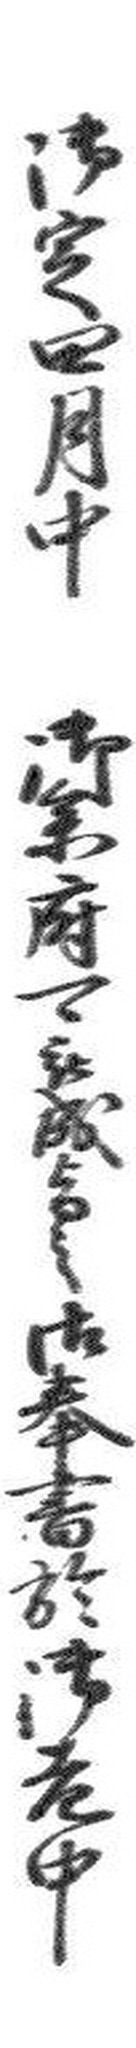御定四月中御参府可被成旨之御奉書於御老中
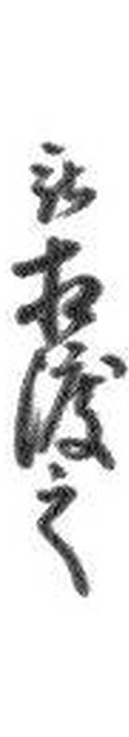被相渡之
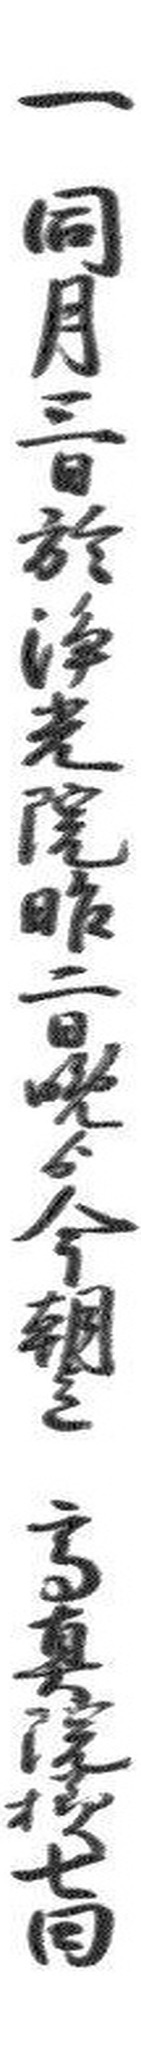一同月三日於浄光院昨二日晩ゟ今朝迄高真院様七回

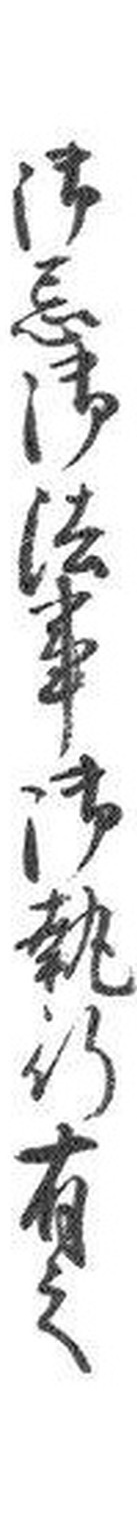御忌御法事御執行有之
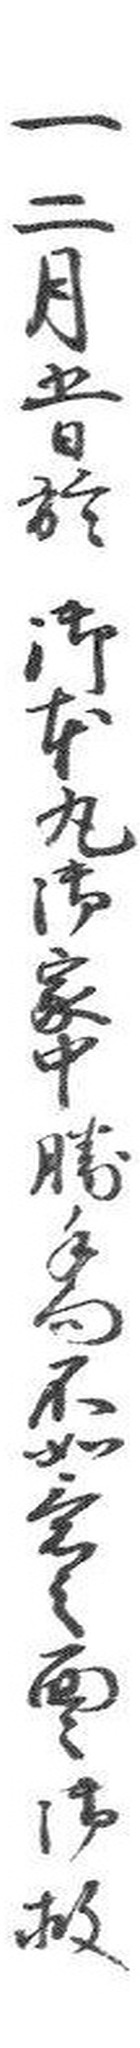一二月五日於御本丸御家中勝手向不如意之面々御救
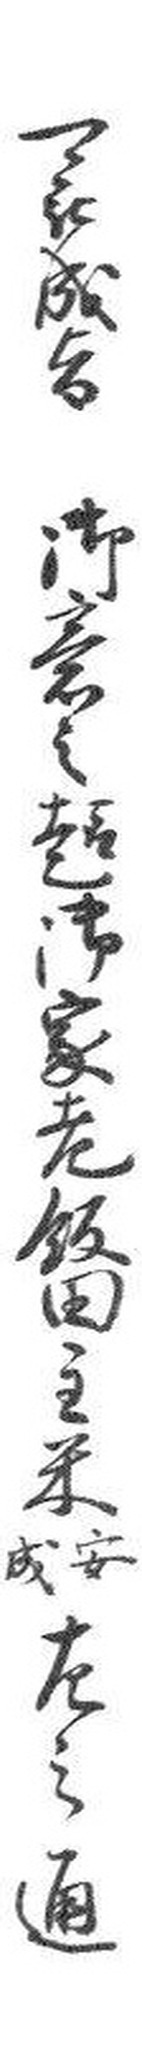可被成旨御意之趣御家老飯田主米安成左之通
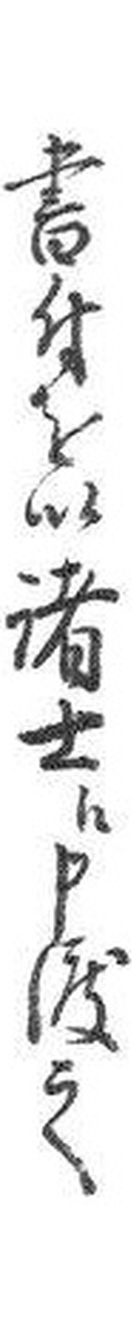書付を以諸士江申渡之
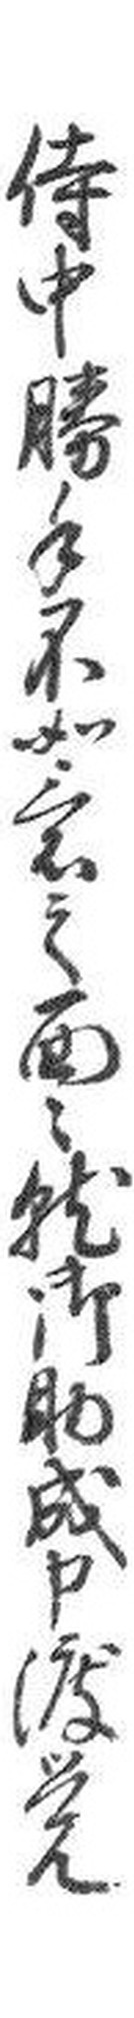侍中勝手不如意之面々就御助成申渡覚
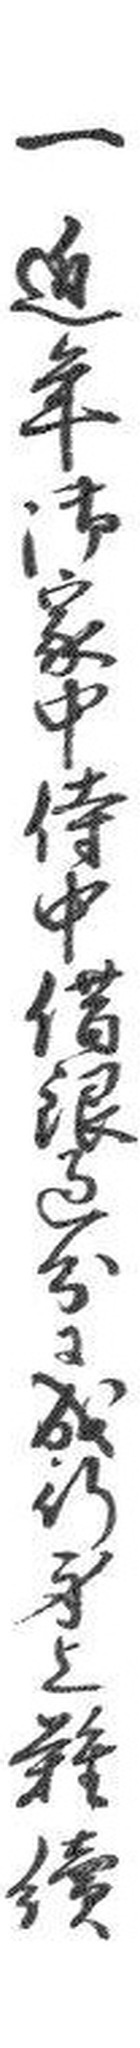一近年御家中侍中借銀過分に成行身上難続
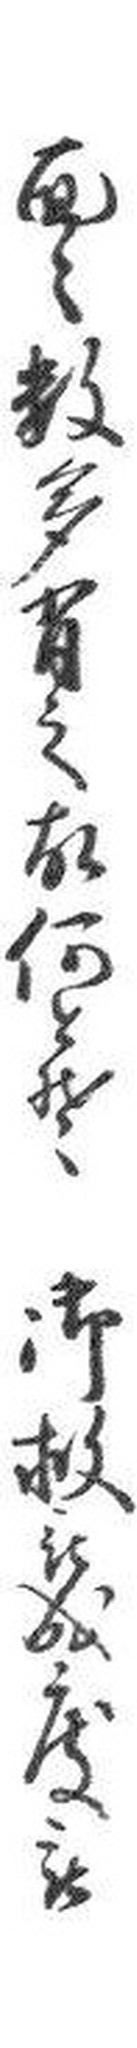面々数多有之故何とそ御救被成度被
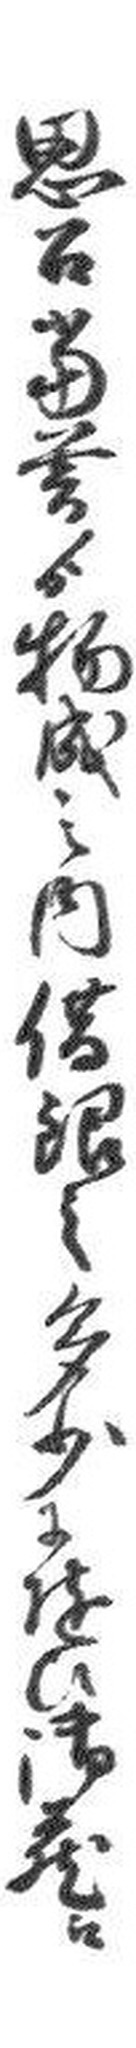思召当暮ゟ物成之内借銀之多少に随ひ御蔵江
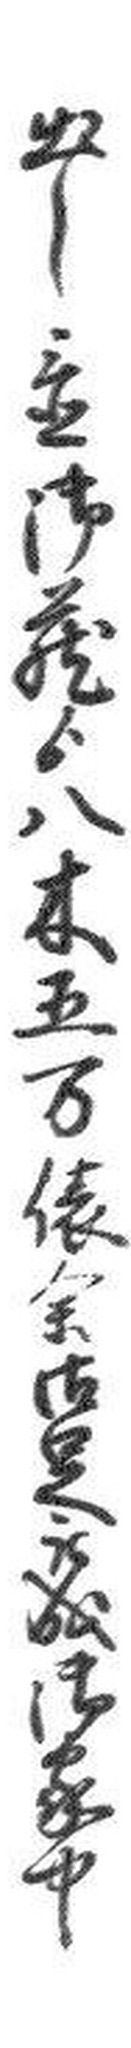出し置御蔵ゟ八木五万俵余御足被成御家中
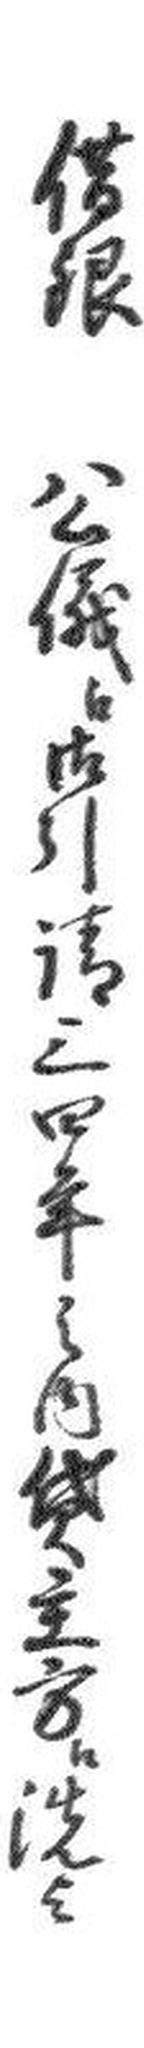借銀公儀江御引請三四年之内貸主方江洗と
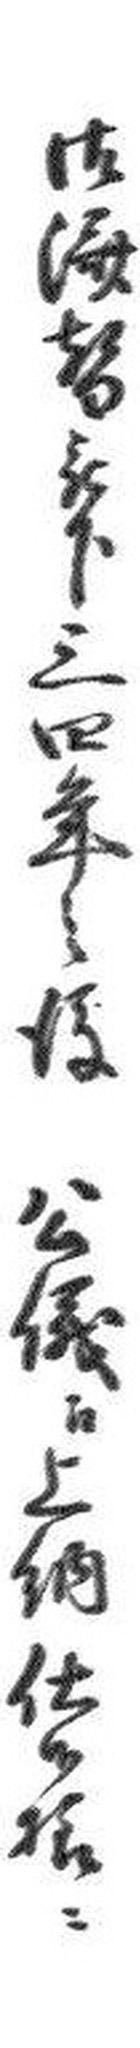御済替被下三四年之後公儀江上納仕候様ニ
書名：家譜 八 光通公 従寛文十年到同十二年
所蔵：福井県文書館 Fukui Prefectural Archives
